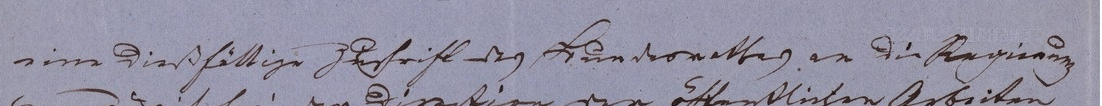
eine dießfällige Zuschrift des Bundesrathes an die Regierung
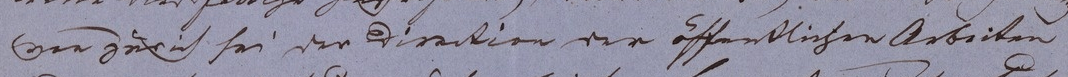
von Zürich sei der Direction der öffentlichen Arbeiten
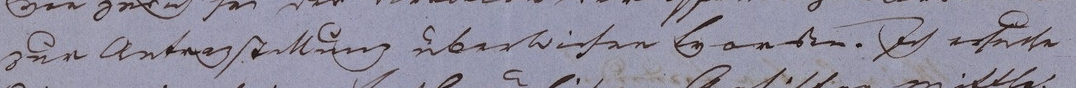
zur Antragstellung überwiesen worden. Ich ersuche
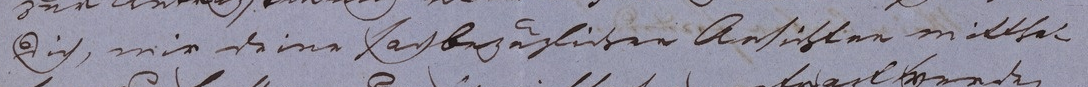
Dich, mir Deine sachbezüglichen Ansichten mitthei-
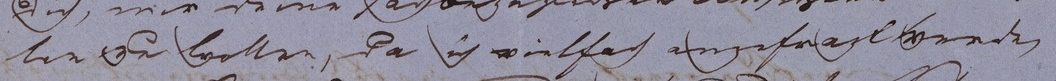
len zu wollen, da ich vielfach angefragt werde,
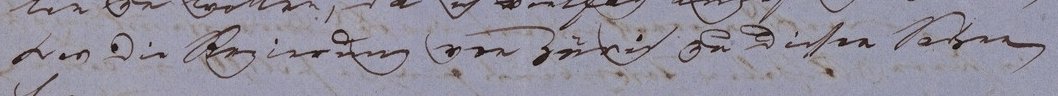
was die Regierung von Zürich zu diesen Sachen
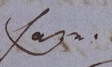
sage.
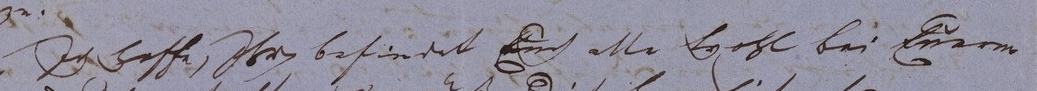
Ich hoffe, Ihr befindet Euch alle wohl bei Euerm
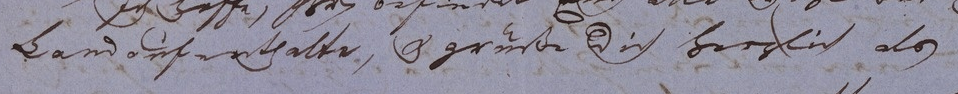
Landaufenthalte, & grüße Dich herzlich als
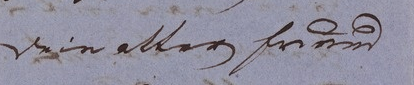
Dein alter Freund
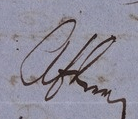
Bern
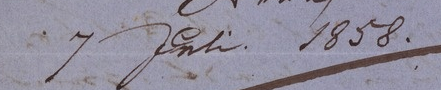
7 Juli. 1858.
